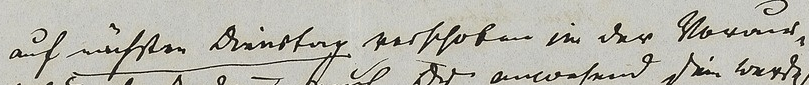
auf nächsten Dienstag verschoben in der Voraus-
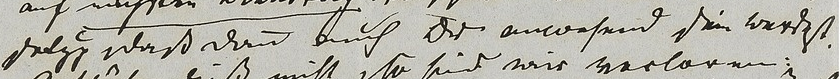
setzung, daß dann auch Du anwesend sein werdest.
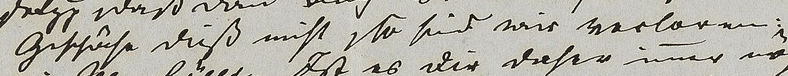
Geschähe dieß nicht, so sind wir verloren:
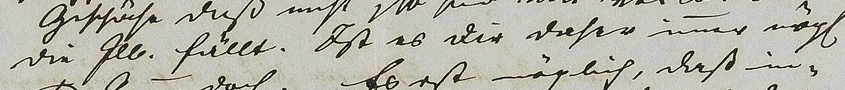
die Ill. fällt. Ist es Dir daher immer möglich
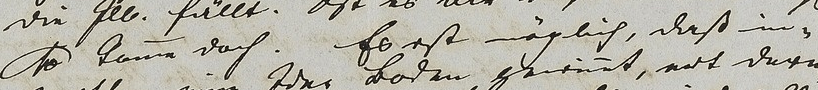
so komme doch. Es ist möglich, daß in-
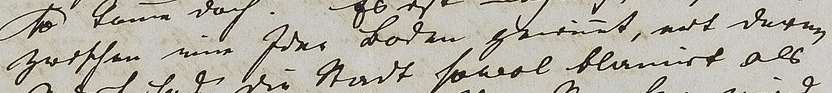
zwischen eine Idee Boden gewinnt, mit deren
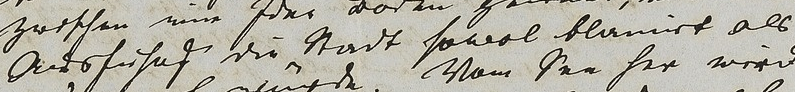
Ausführung die Stadt sowol blamirt als
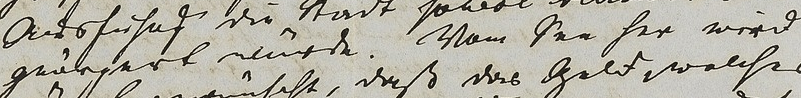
geärgert würde. Vom See her wird
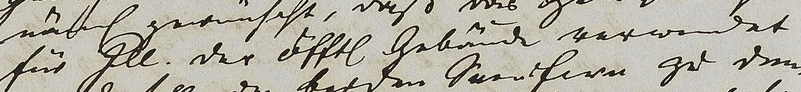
für Ill. der öfftlichen Gebäude verwendet
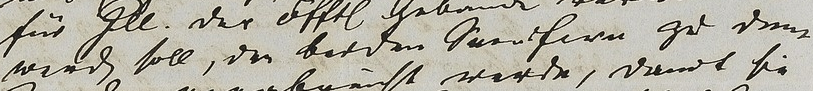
werden soll, den beiden Seeufern zu dem
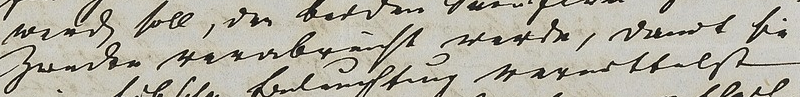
Zwecke verabreicht werde, damit sie
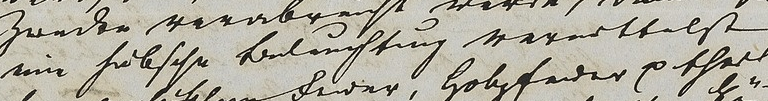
eine hübsche Beleuchtung vermittelst
